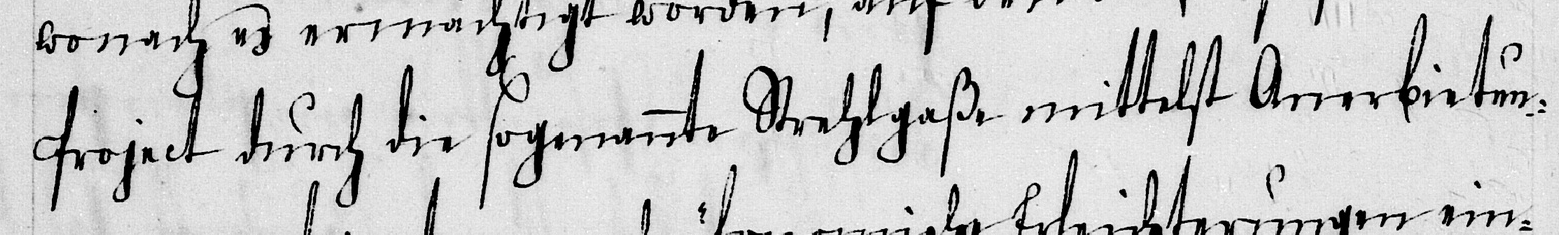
Project durch die sogenannte Strehlgaße mittelst Anerbietun¬
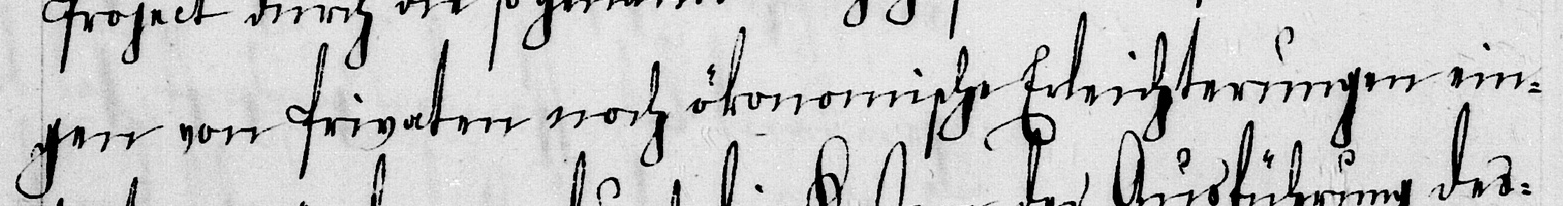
gen von Privaten noch ökonomische Erleichterungen ein¬
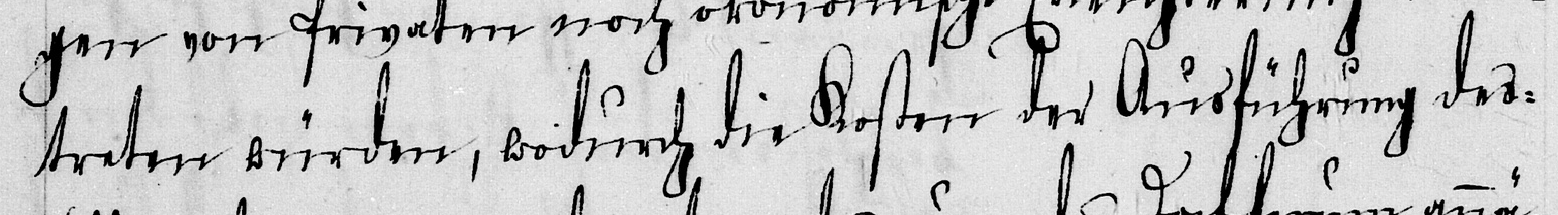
treten würden, wodurch die Kosten der Ausführung des¬
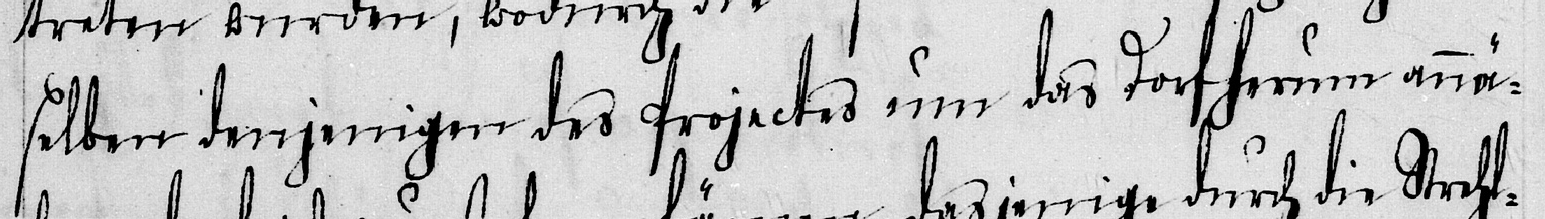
selben denjenigen des Projectes um das Dorf herum annä¬
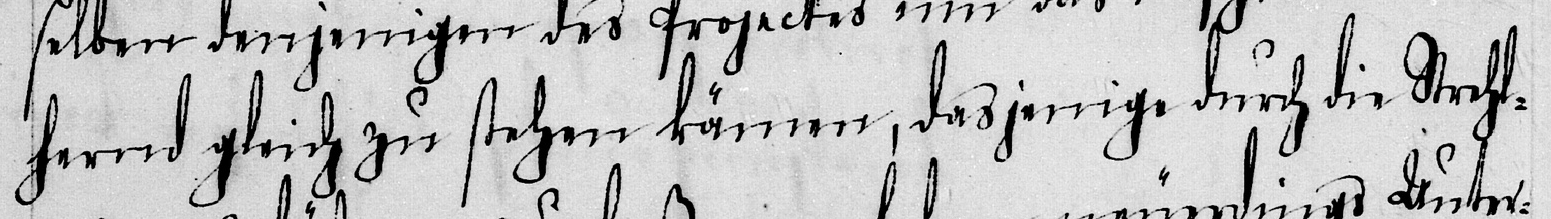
hernd gleich zu stehen kämen, dasjenige durch die Strehl¬
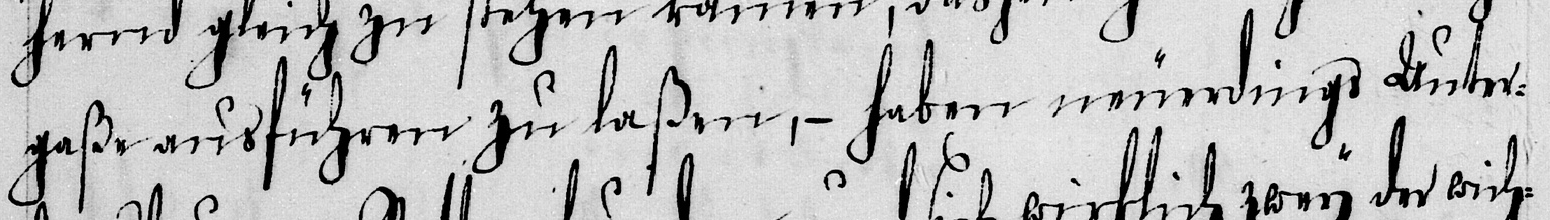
gaße ausführen zu laßen, – haben neuerdings Unter¬
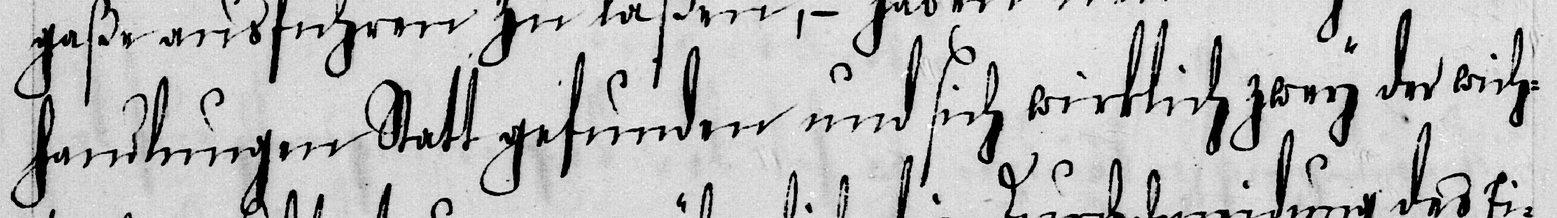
handlungen Statt gefunden und sich wirklich zwey der wi¬
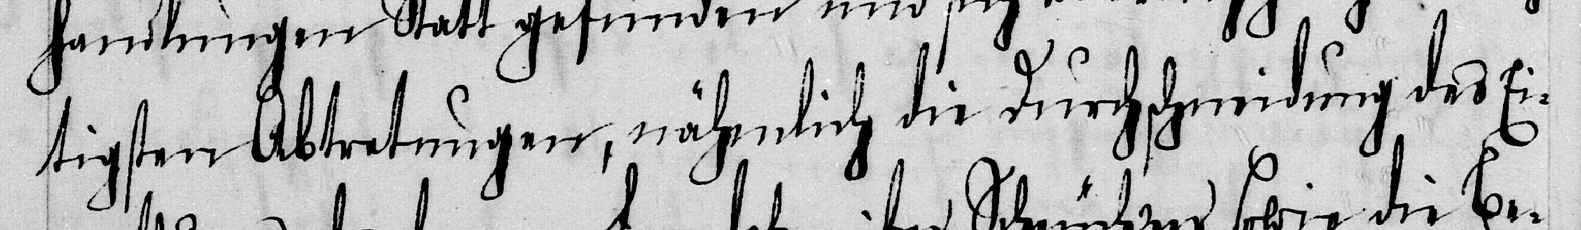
tigsten Abtretungen, nähmlich die Durchschneidung des Ei¬
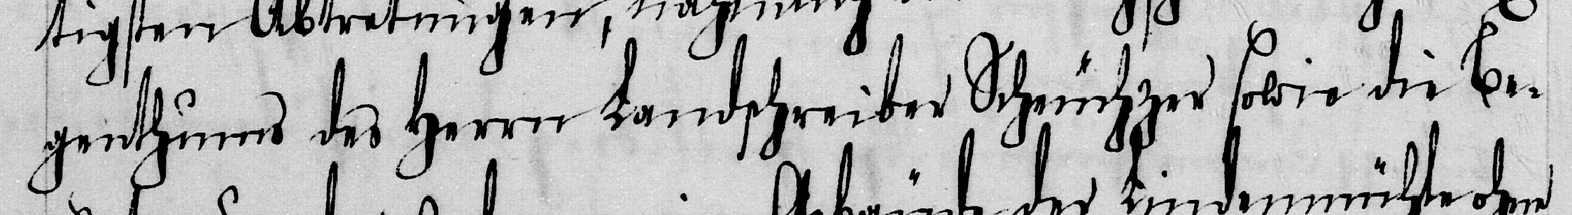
genthums des Herrn Landschreiber Scheuchzer sowie die Be¬
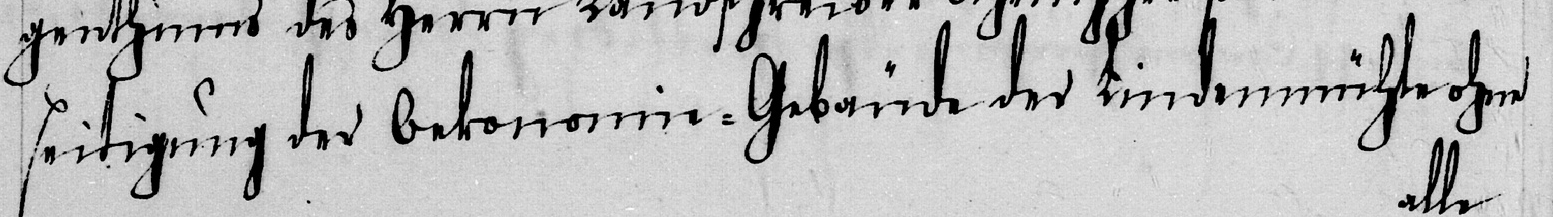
seitigung der Oekonomie-Gebäude der Lindenmühle ohne
